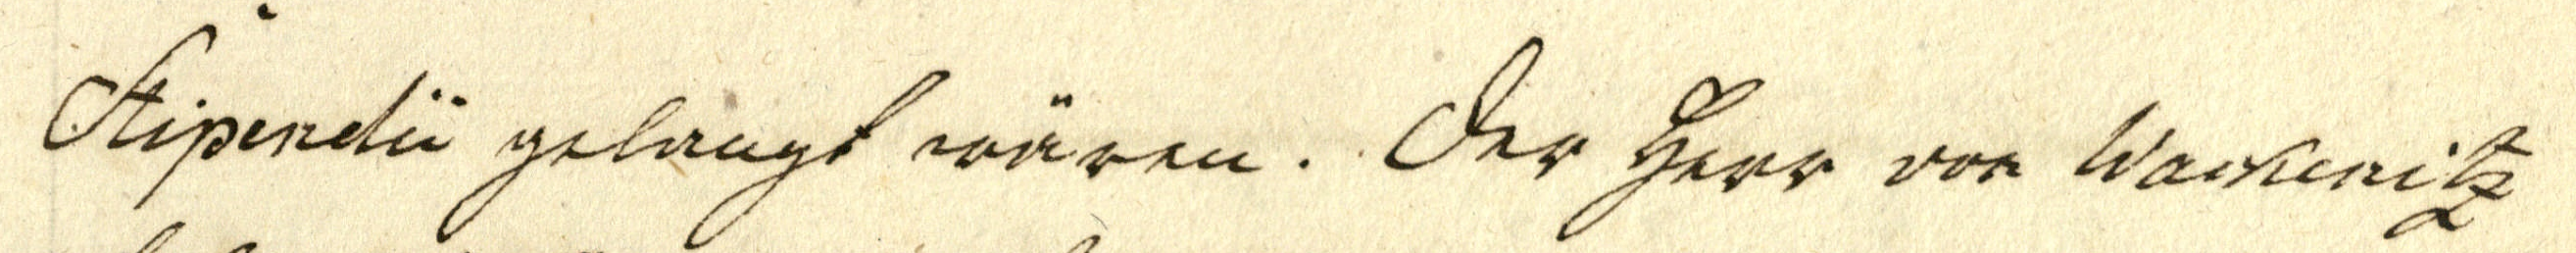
Stipendii gelangt wären. Der Herr von Wackenitz
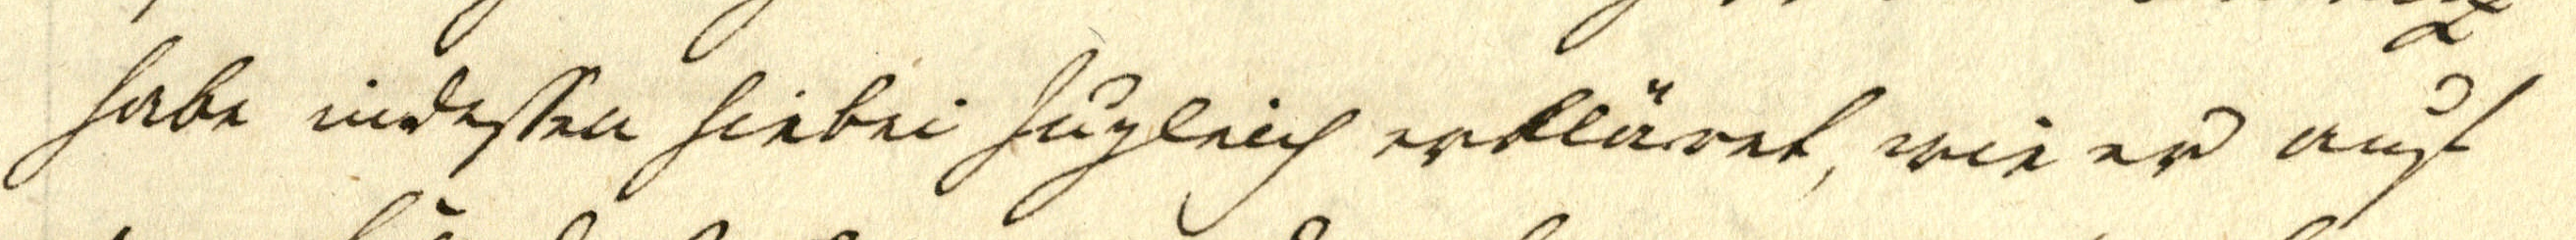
habe indessen hiebei zugleich erkläret, wir er auf
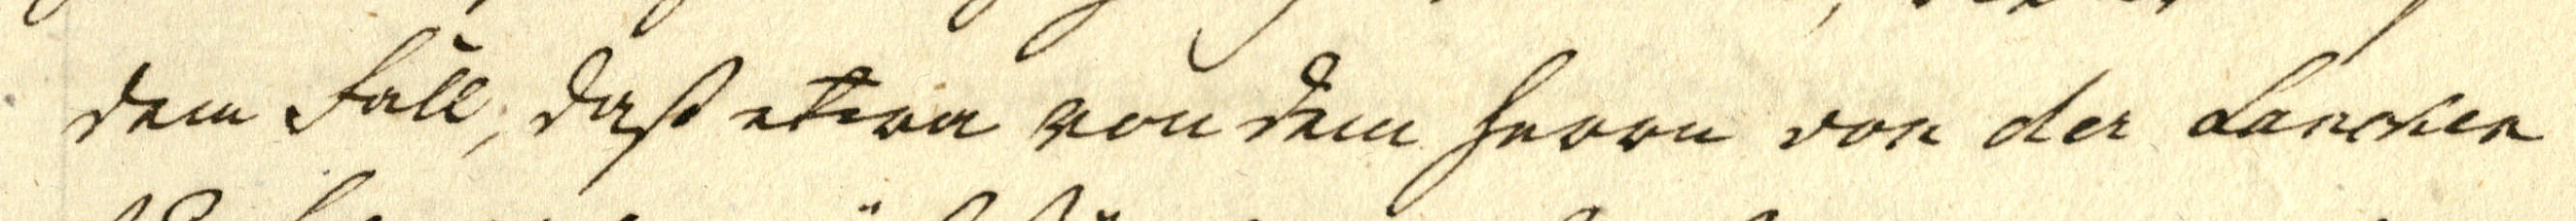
dem Fall, daß etwa von dem herrn von der Lancken
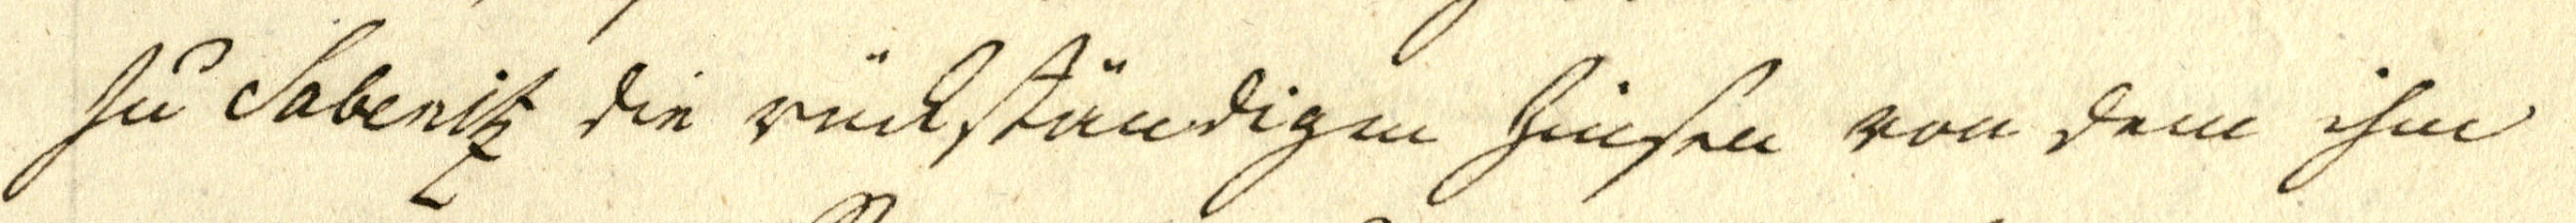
zu Sabenitz die rückständigen Zinsen von dem ihm
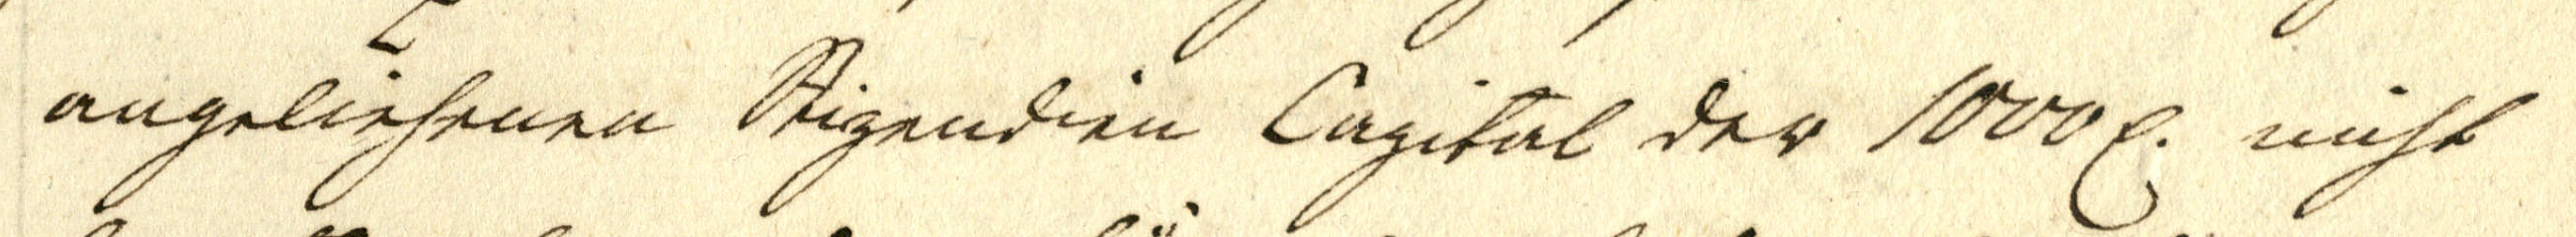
angeliehenen Stipendien Capital der 1000 l. nicht
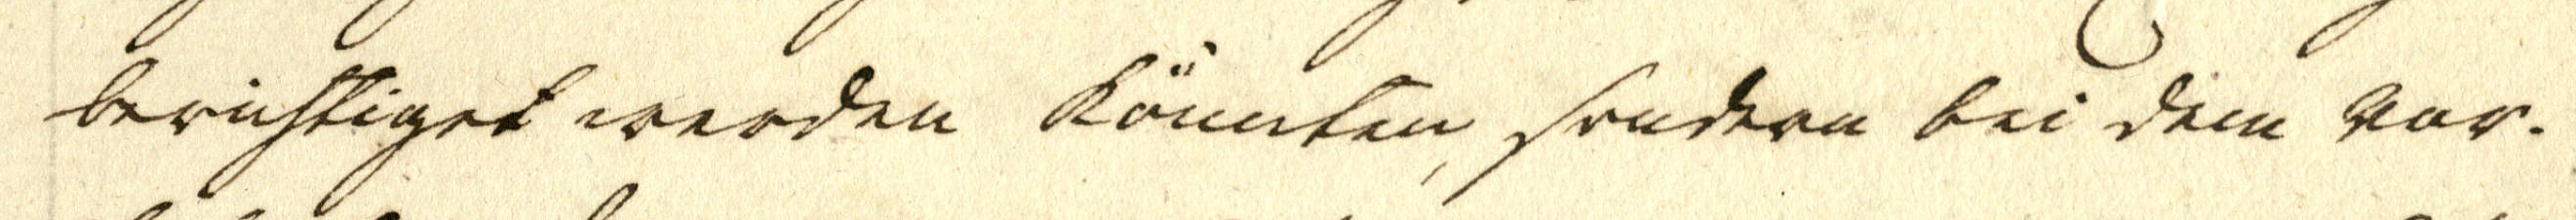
berichtiget werden könnten, sondern bei dem vor¬
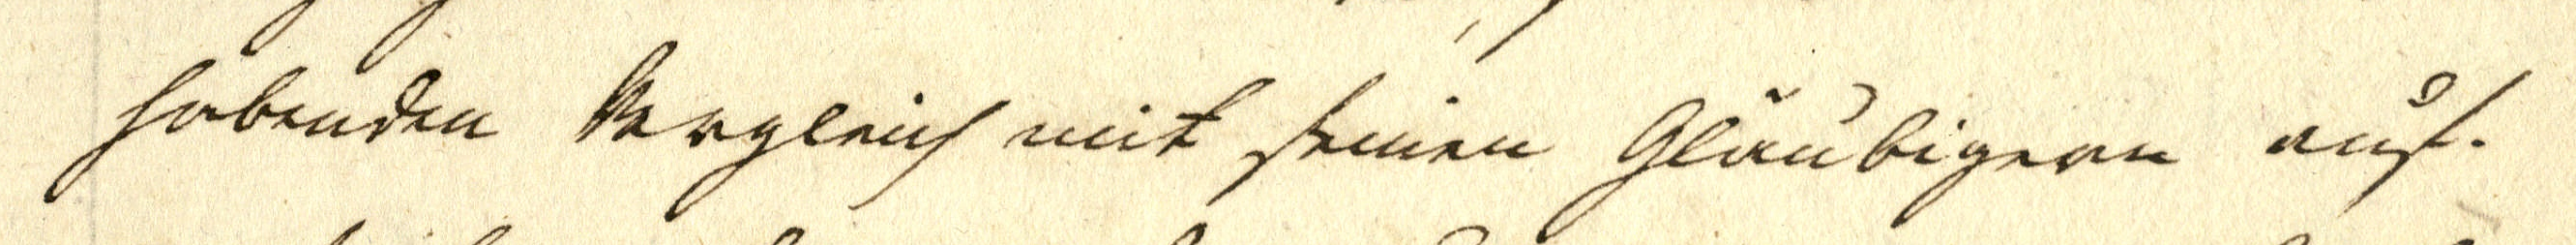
habenden Vergleich mit seinen Gläubigern auf¬
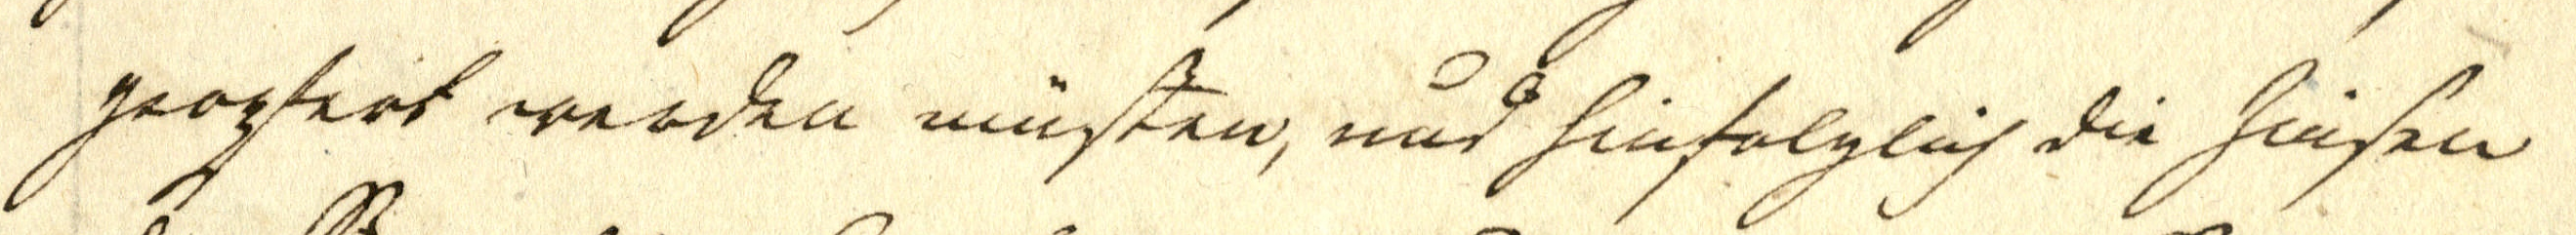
geopfert werden müsten, und hinfolglich die Zinsen
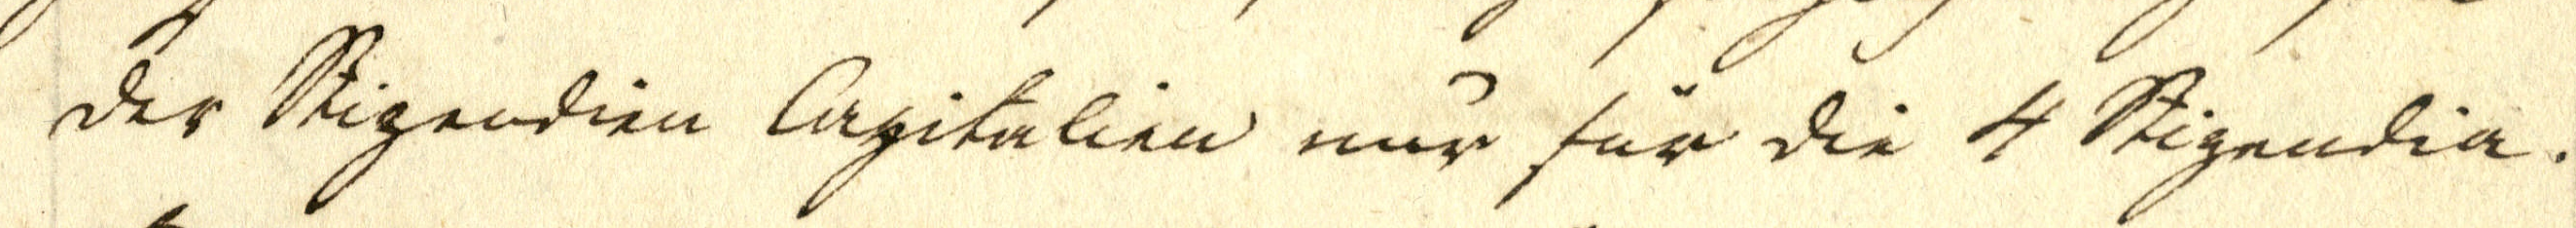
der Stipendien Capitalien nur für die 4 Stipendia¬
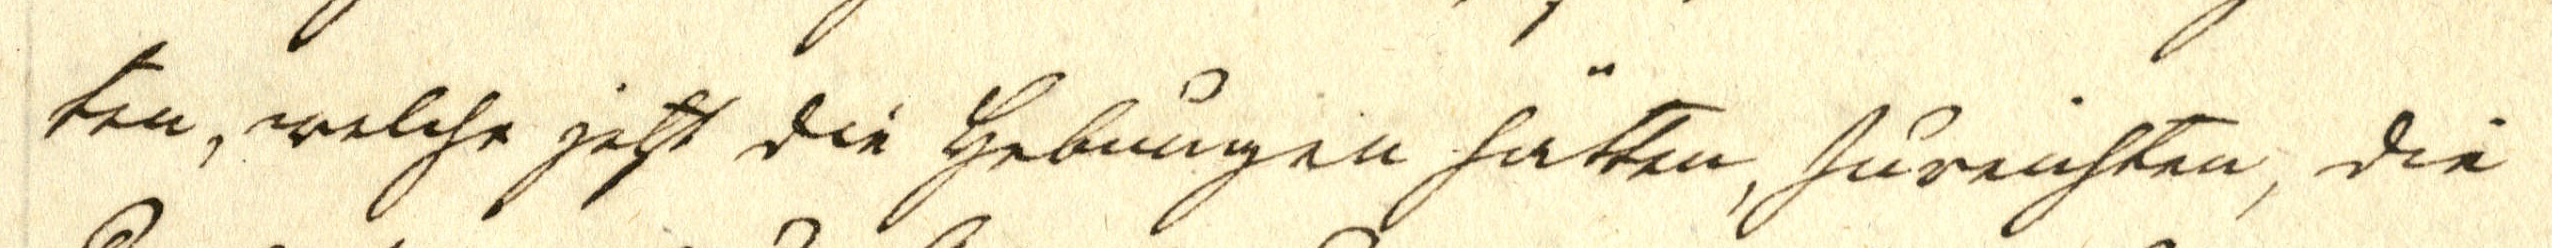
ten, welche jetzt die Hebungen hätten, zureichten, die
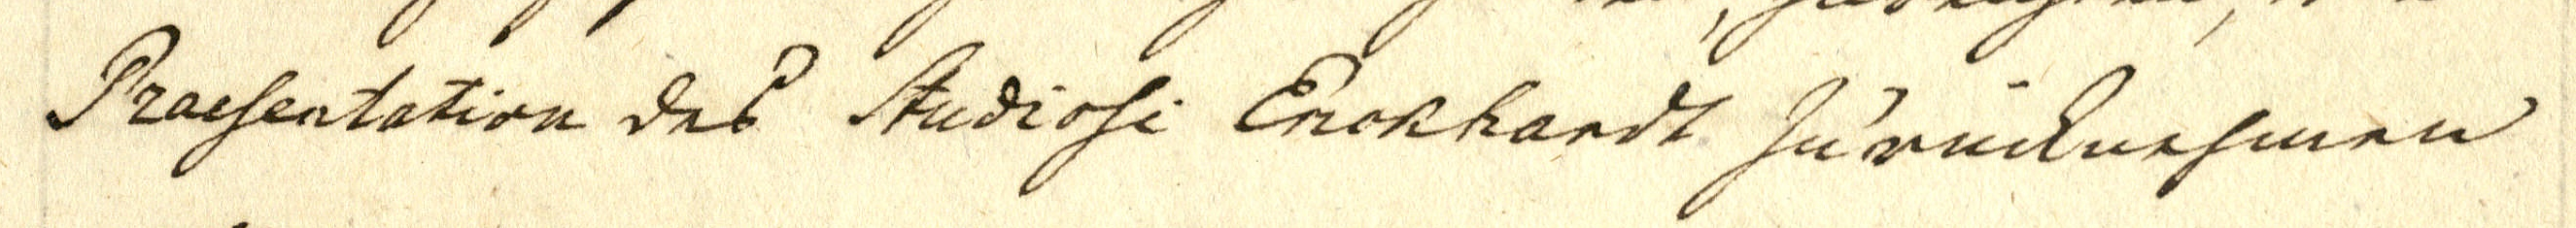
Praesentation des Studiosi Enckhardt zurücknehmen
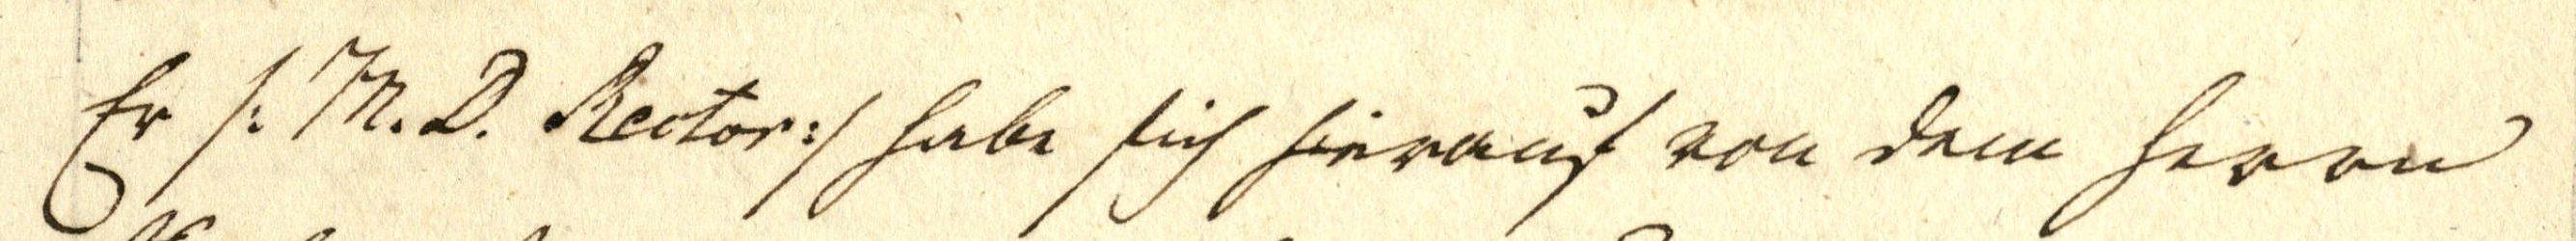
Er / M. D. Rector / habe sich hierauf von dem herrn
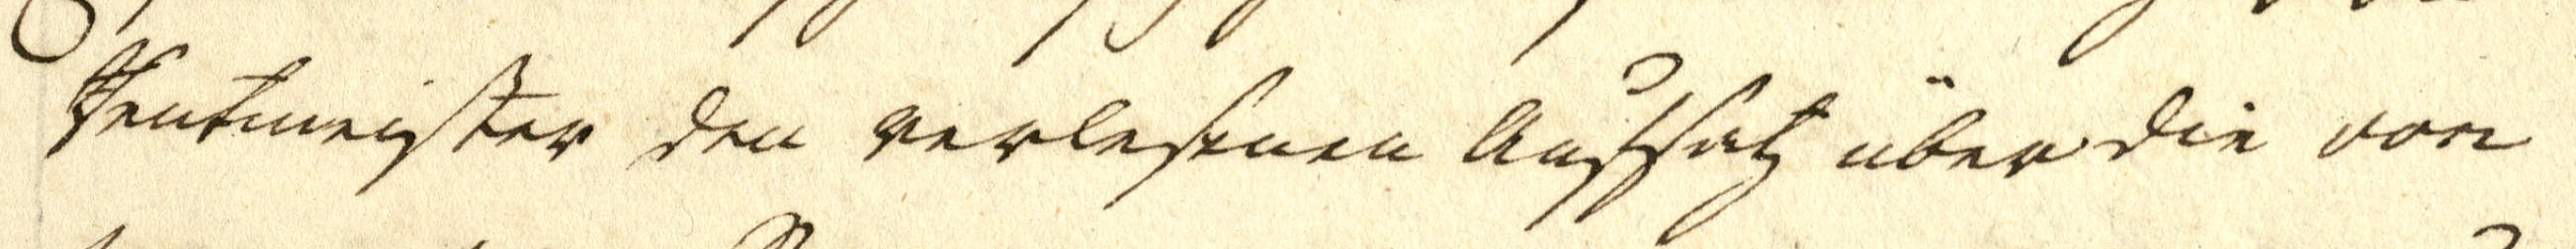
Rentmeister den verlesenen Aufsatz über die von
